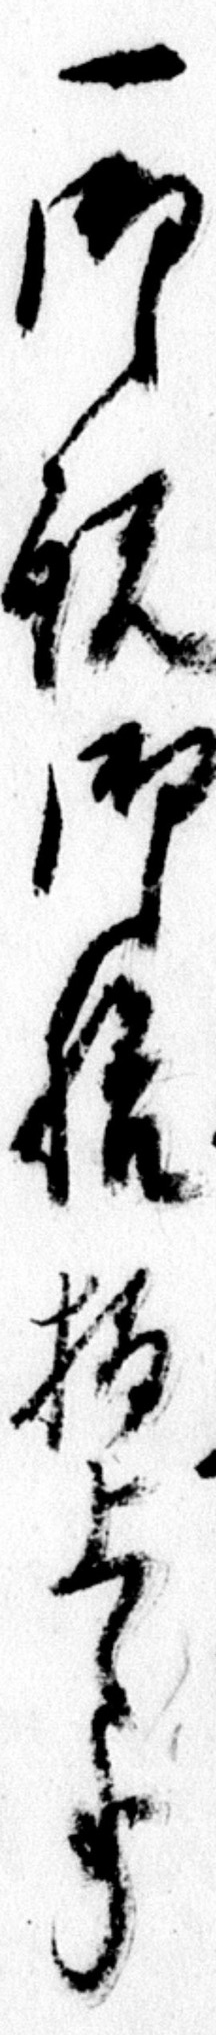一御祝御膳指上候事
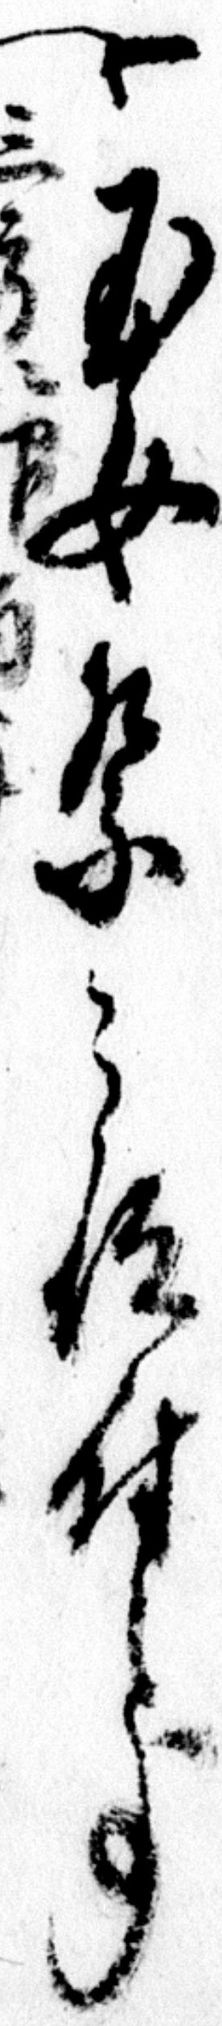一玉女祭被仰付候事
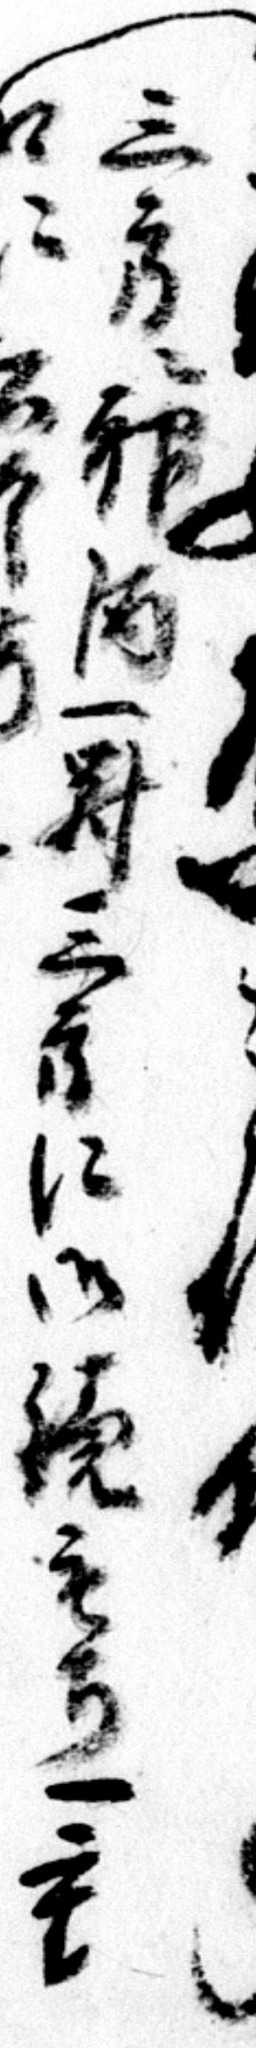三方ニ神酒一對三方に御鏡もち一重
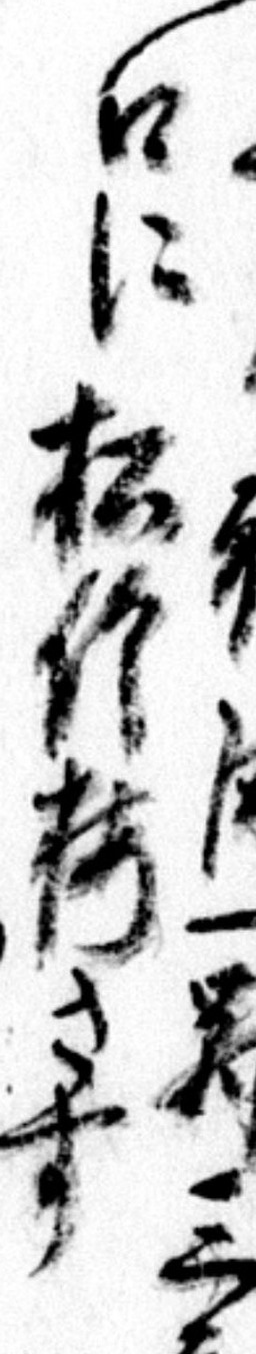口に松竹梅さす
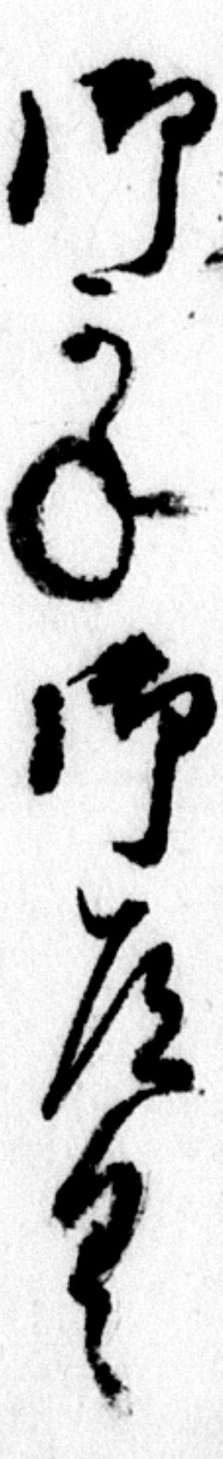御かね御道具
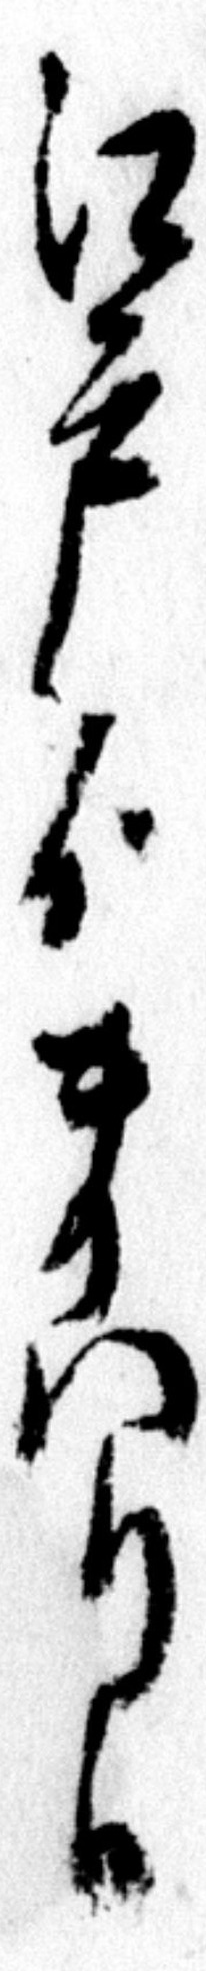筈江戸ゟまいり候
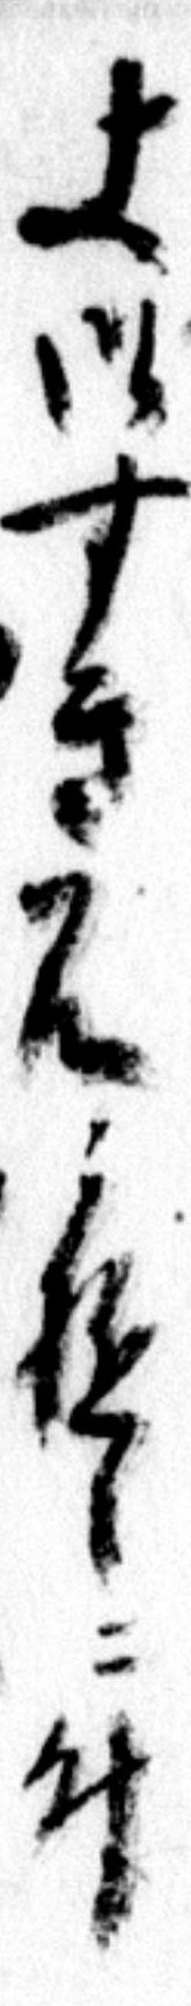上御すき見被遊候ニ付
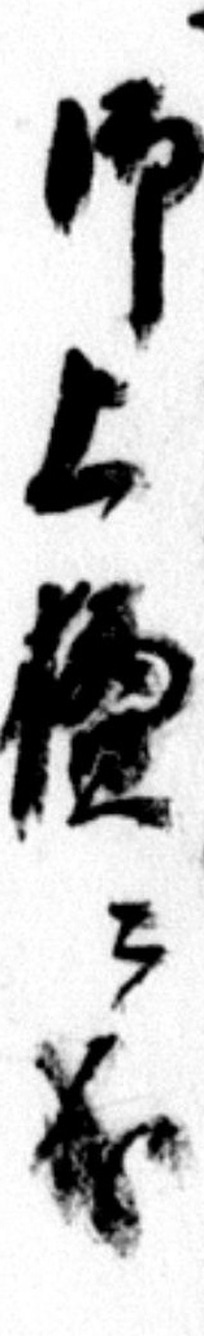御上壇ニ成
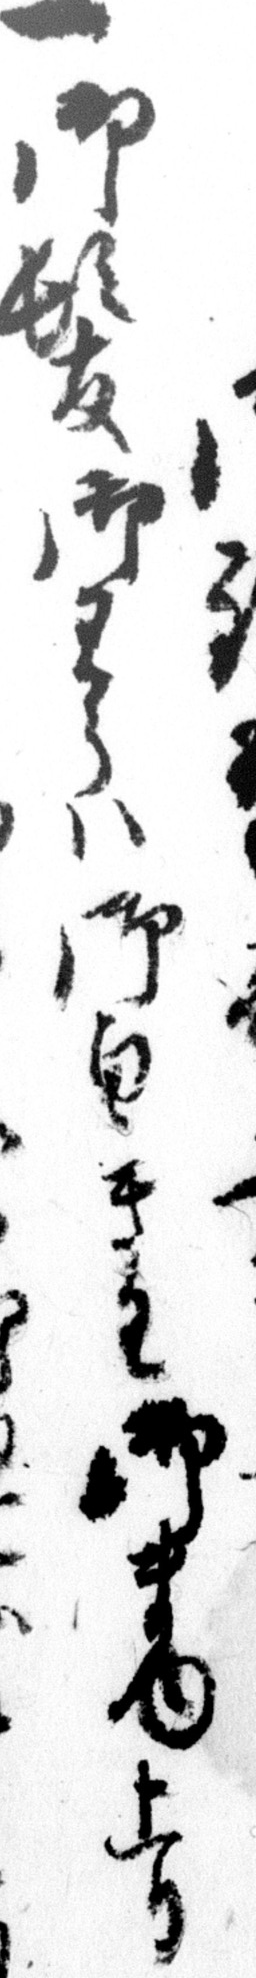一御髪御わらハ御白きわ御まゆ上り
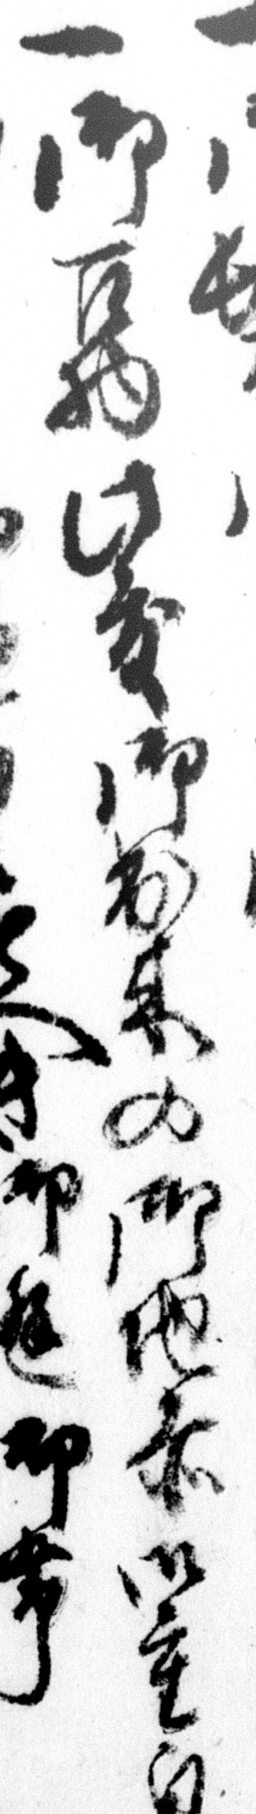一御召物此度御出来の御地赤御重白
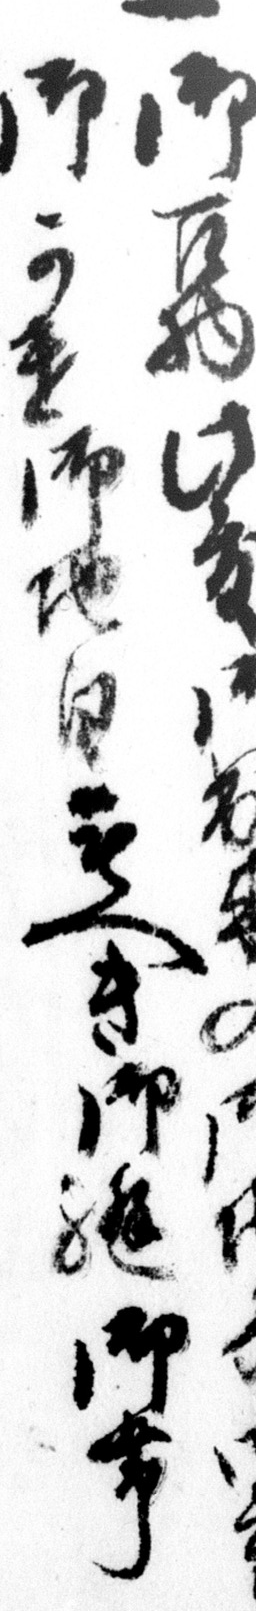御かけ御地白もへき縫御帯
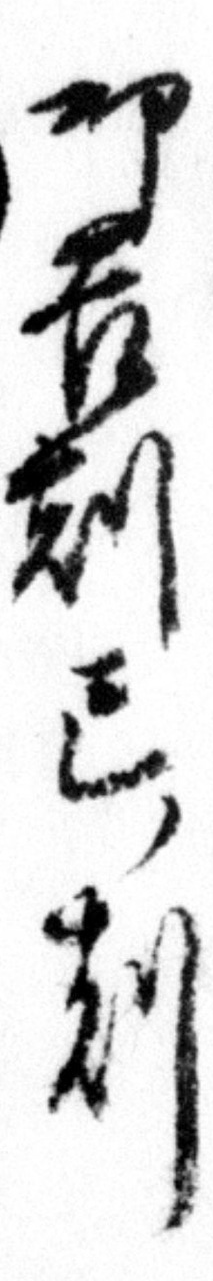御吉刻巳ノ刻
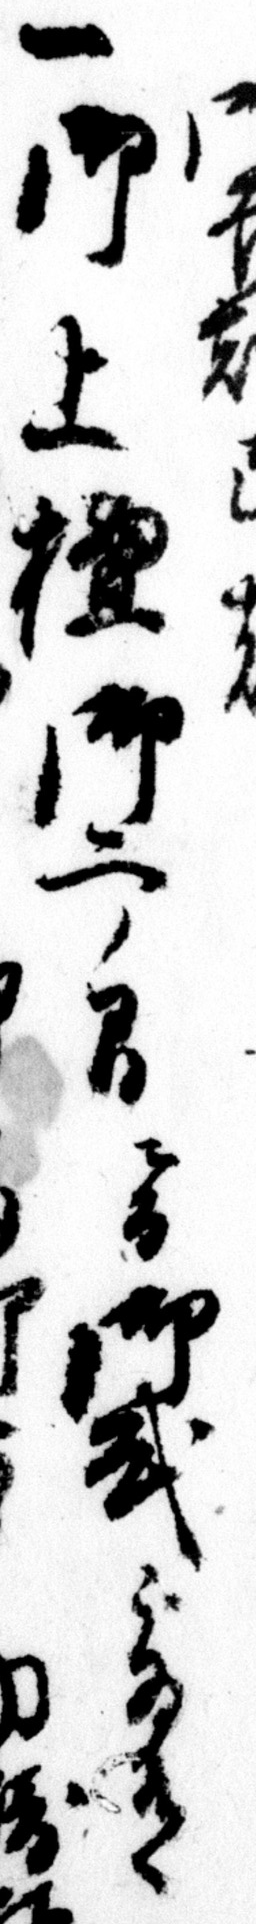一御上壇御二ノ間ニ而御式被為有候
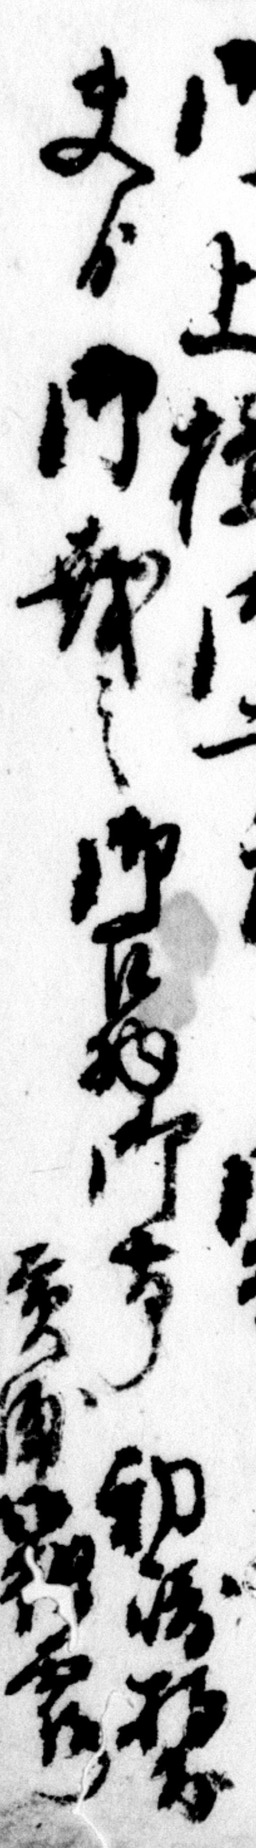夫ゟ御戴之御召物御帯初崎持出

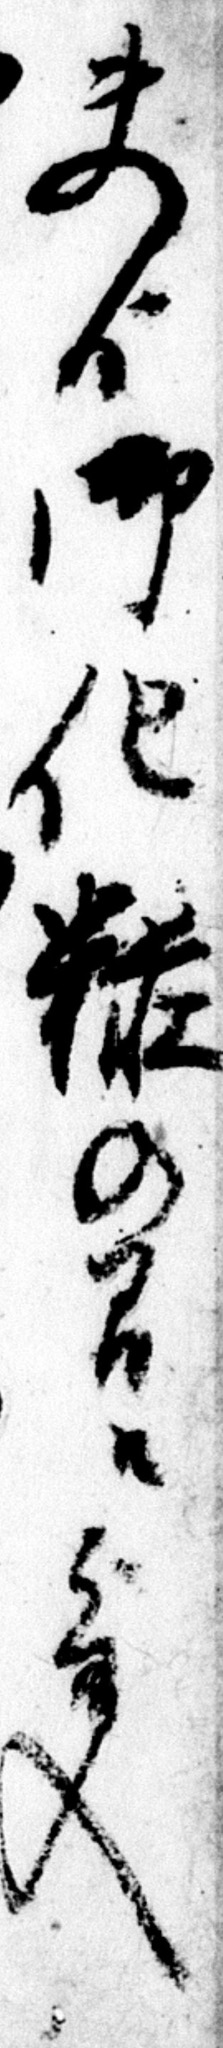夫ゟ御化粧の間ニ被御入
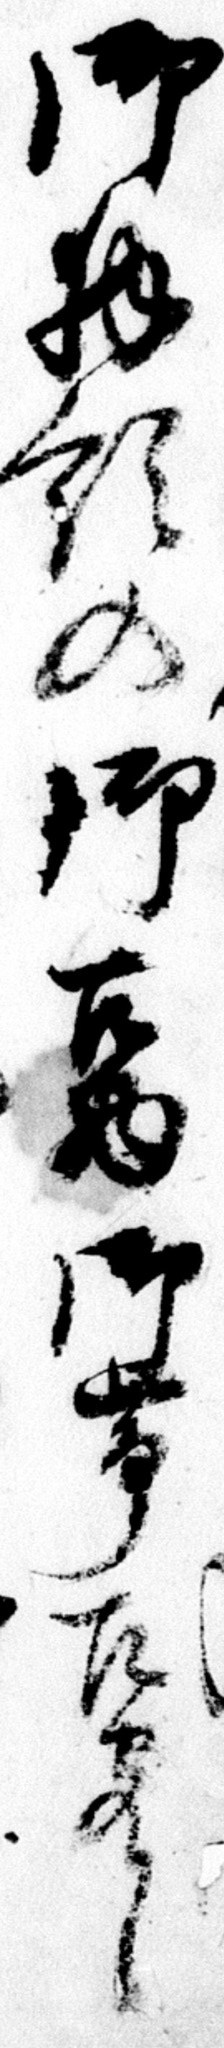御拝領の御召物御帯召せ給候
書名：光姫様御かねはじめ御式
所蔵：徳島県立図書館
